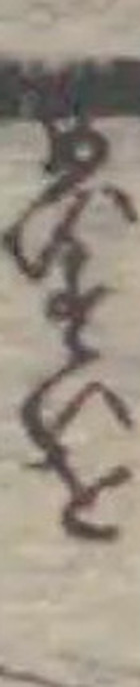めいすいを
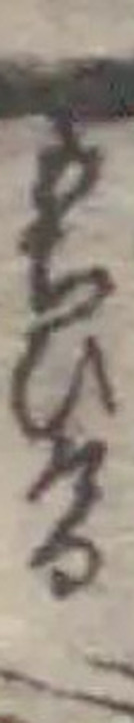もちひける
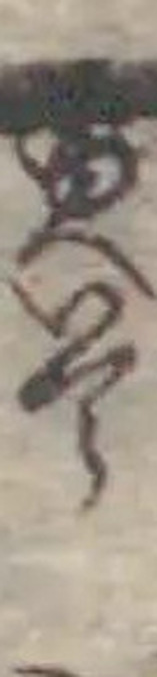ゆへいくら
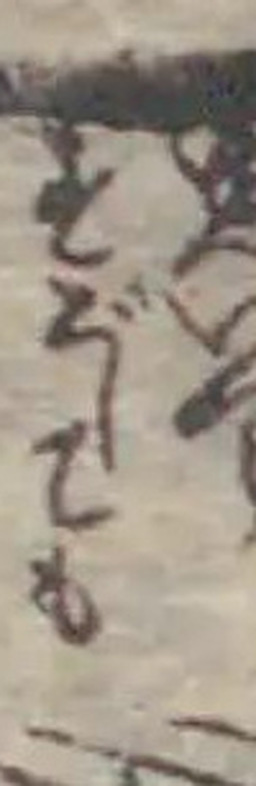すごしても
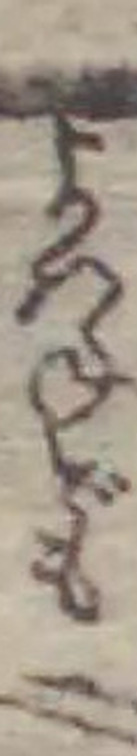よはねども
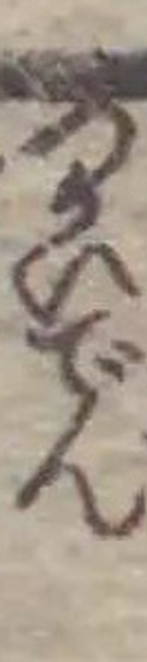つかいでん
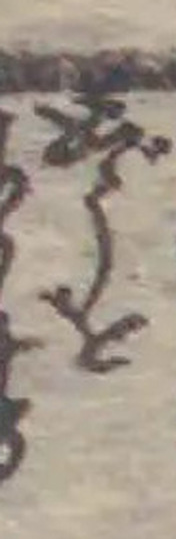どうを
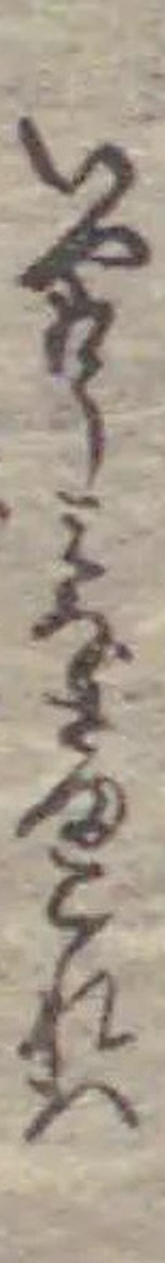いやめうみなさまこれは
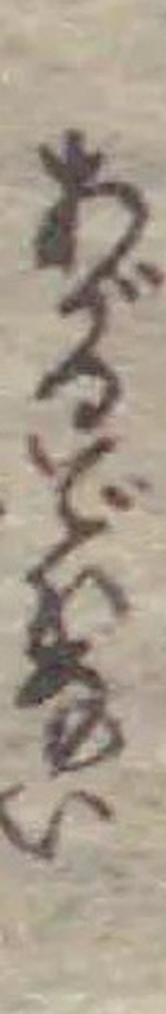あがるではない
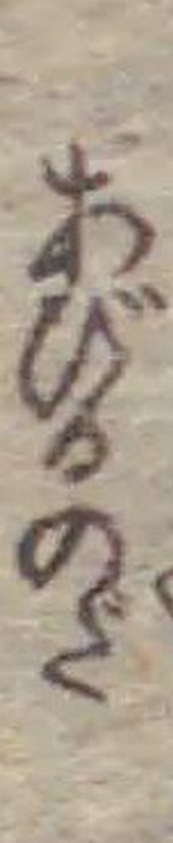あびるのだ
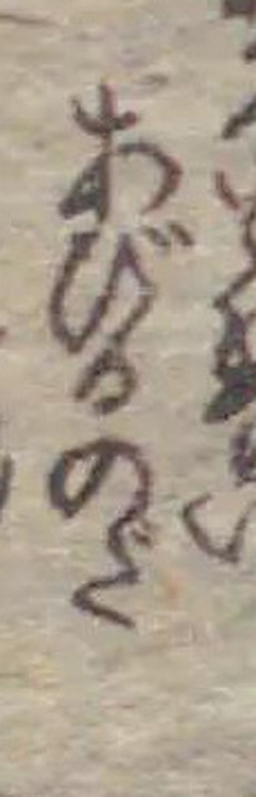あびるのだ
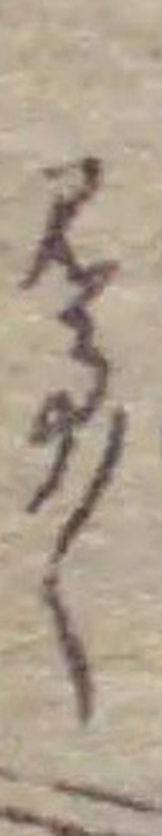見事〳〵

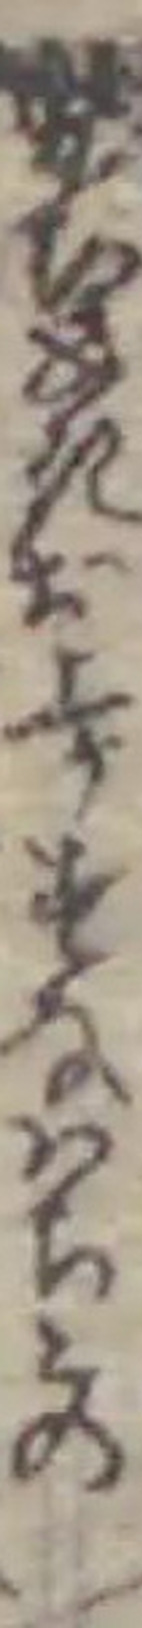かちときお上ケすなはちこの
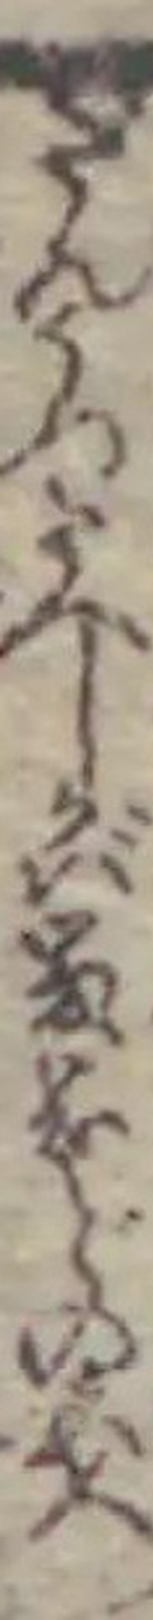だんうつたへしかば藤岡どの五人
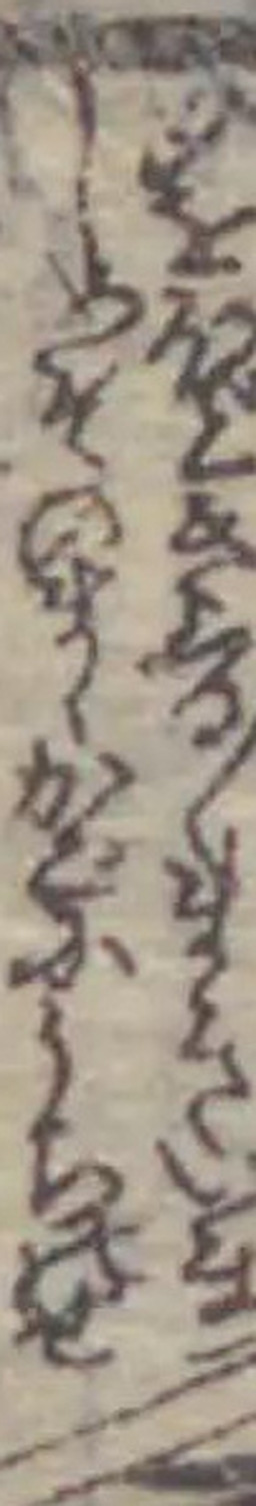しめそのまゝかごにうちのせ
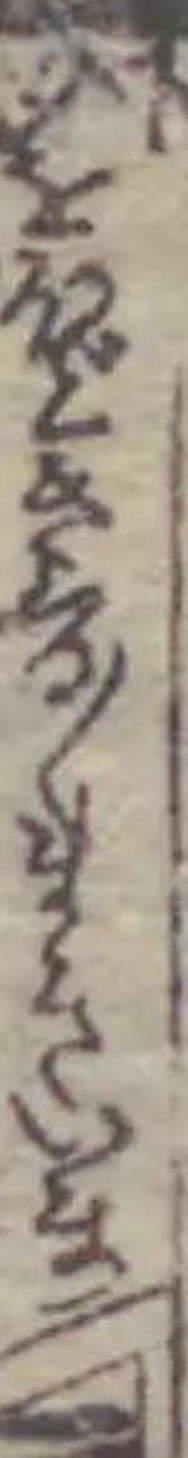〆をほどきくる〳〵まきいま
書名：藝者五人娘 2巻
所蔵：国立国会図書館 National Diet Library, JAPAN
